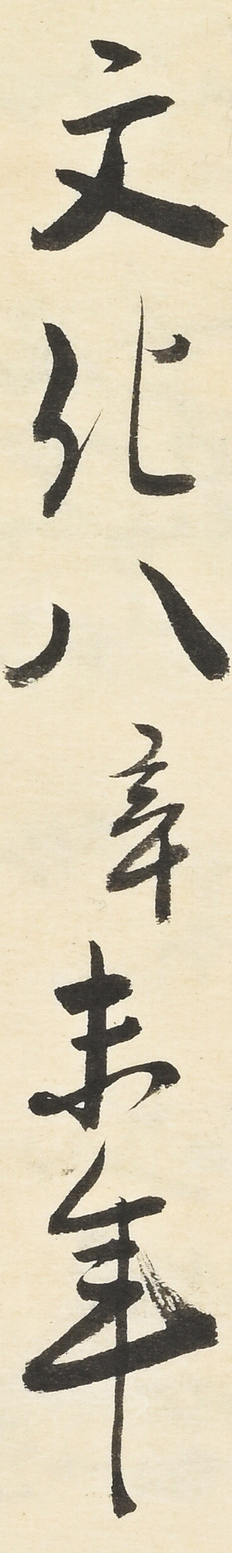文化八辛未年
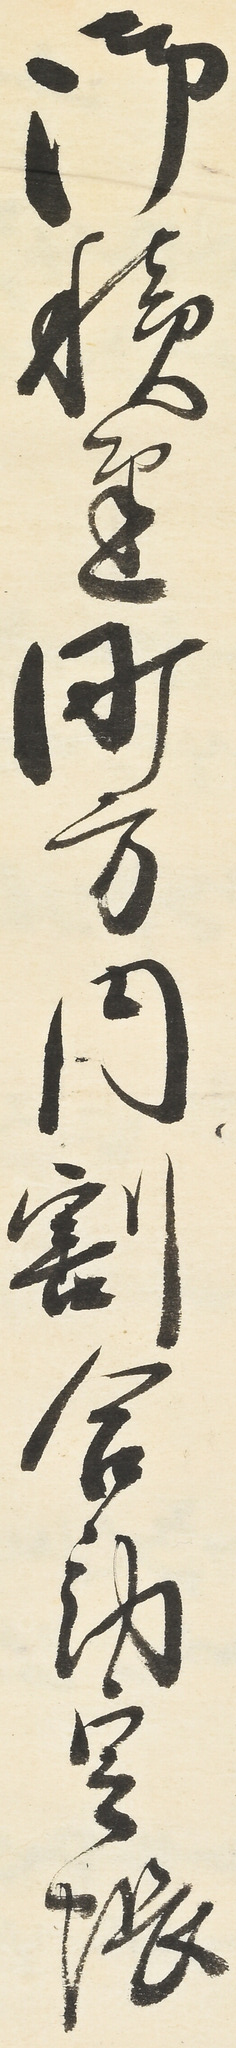御積金町方割合勘定帳

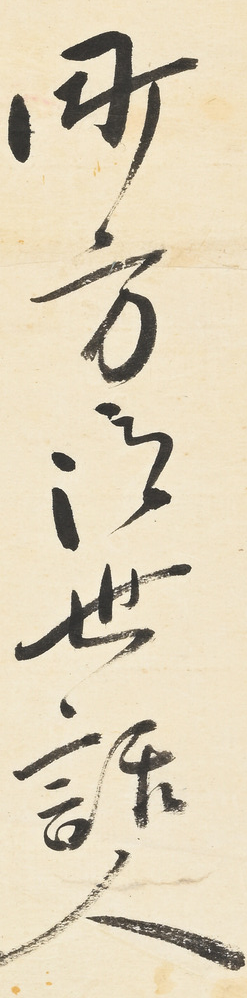町方御世話人
